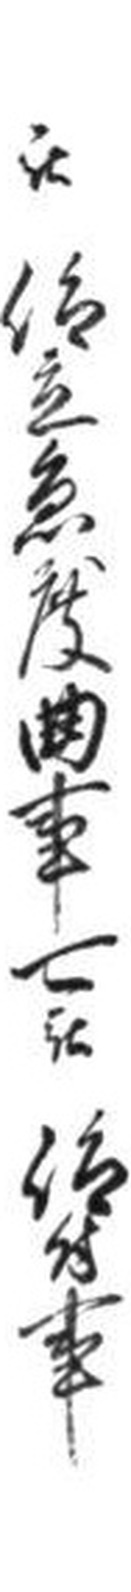被仰立急度曲事可被仰付事
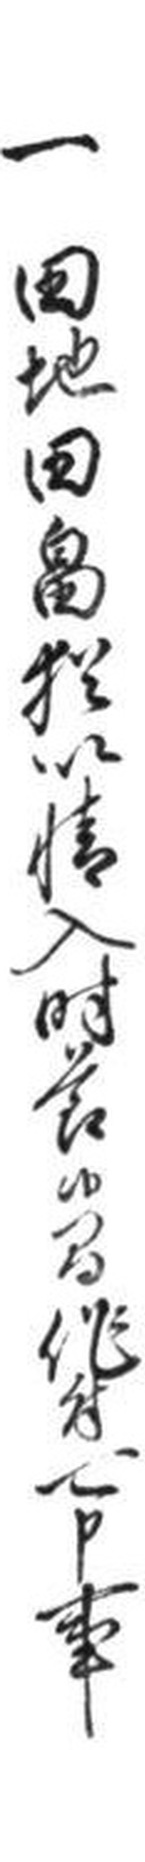一田地田畠猶以情入時節候間作付可申事
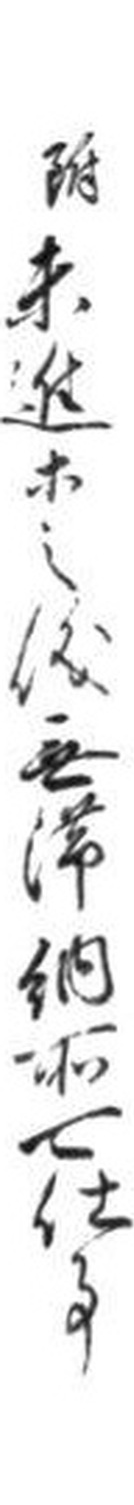附未進等之儀無滞納所可仕事
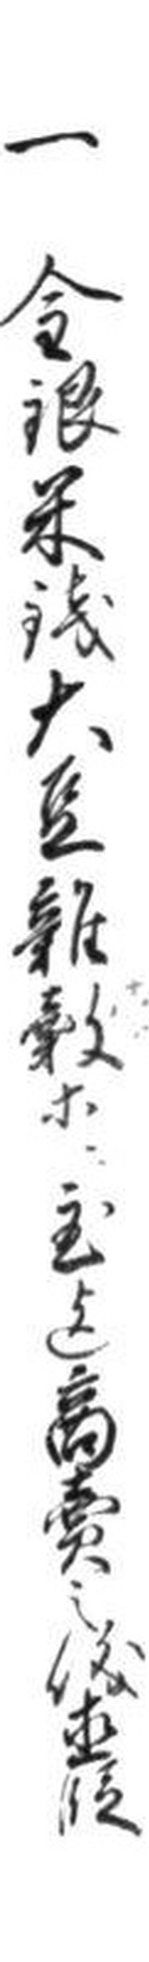一金銀米銭大豆雑穀等ニ至迄商売之儀直段
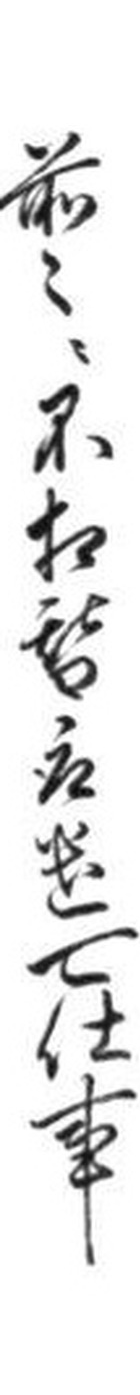前々ニ不相替取遣可仕事
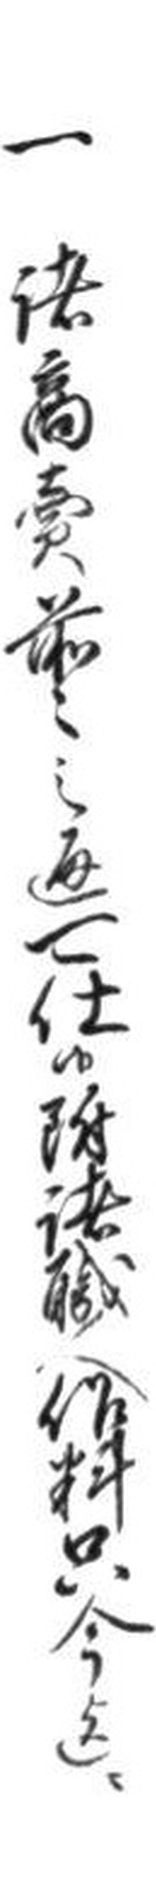一諸商売前々之通可仕候附諸職人役料只今迄ニ
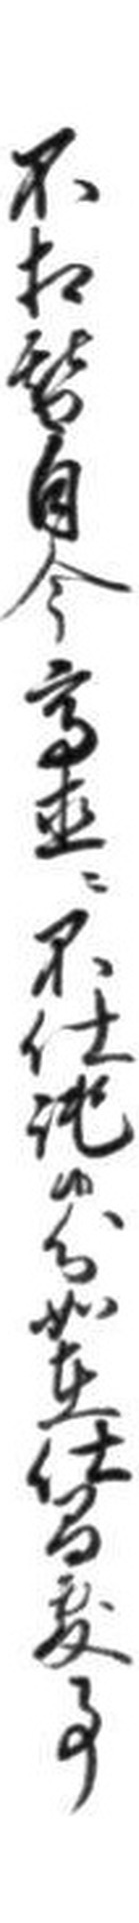不相替自今高直ニ不仕訳候分如在仕間敷事
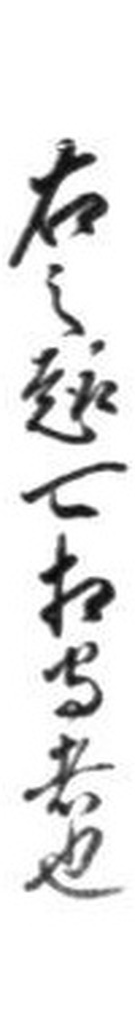右之趣可相守者也
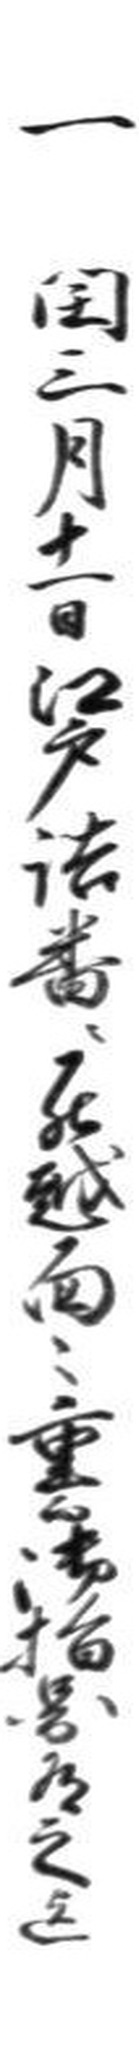一閏三月十一日江戸諸番ニ罷越面々重而御指図有之迄
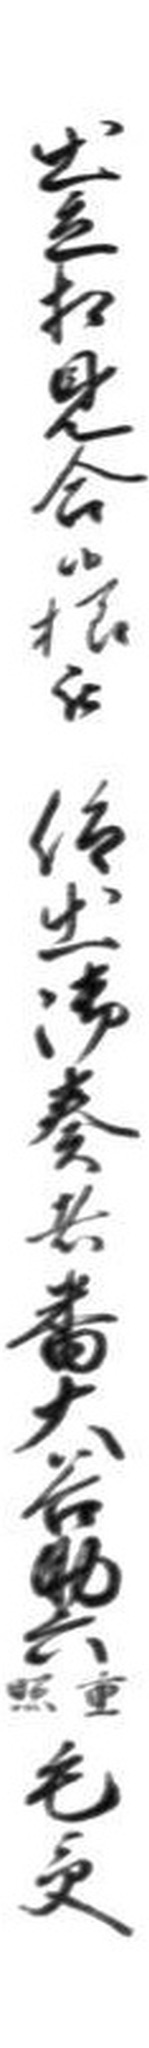出立相見合候様被仰出御奏者番大谷助六重照毛受
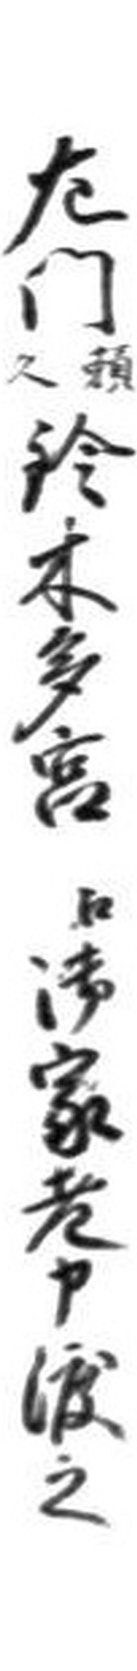左門頼久鈴木多宮江御家老申渡之
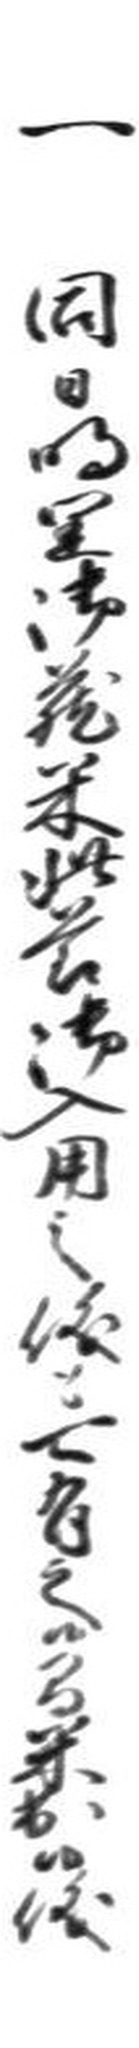一同日明里御蔵米此節御入用之儀も可有之候間米出候儀
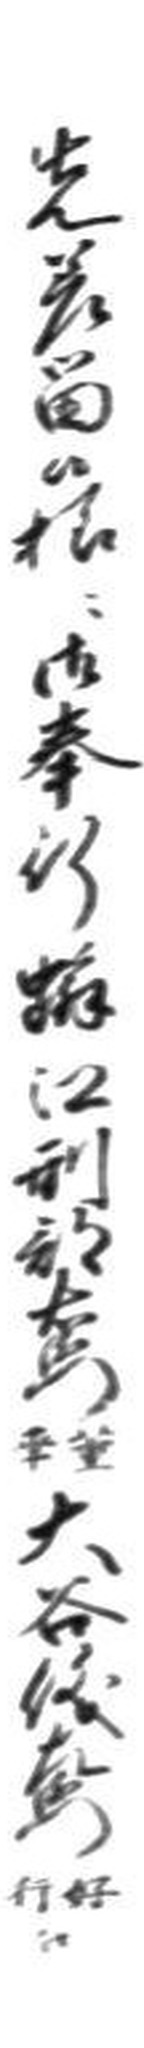先差留候様ニ御奉行蟹江刑部右衛門董平大谷儀左衛門好行江
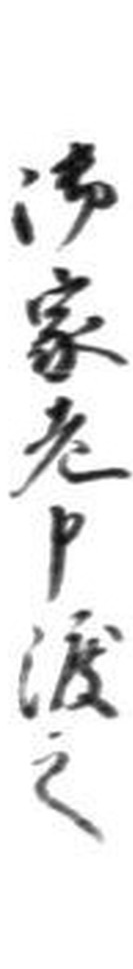御家老申渡之
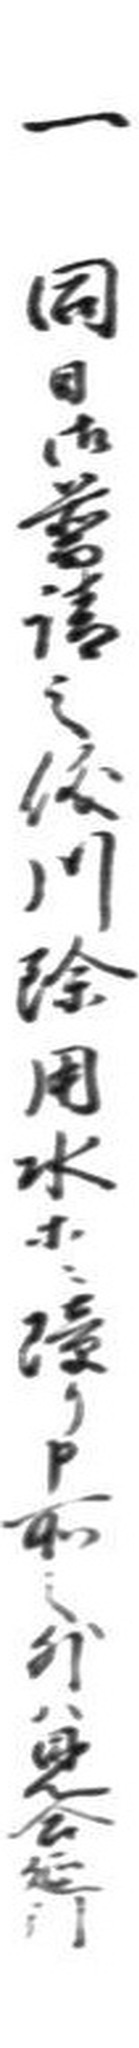一同日御普請之儀川除用水等ニ限り申所之外ハ見合延引
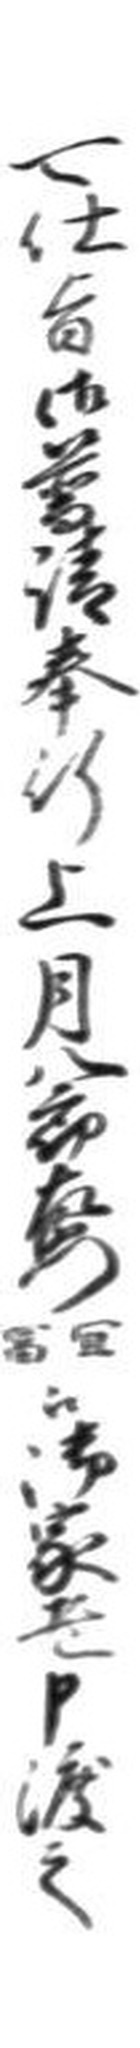可仕旨御普請奉行上月八郎左衛門宜冨江御家老申渡之
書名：家譜 十六 吉品公 従貞享三年閏三月到同四年
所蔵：福井県文書館 Fukui Prefectural Archives
